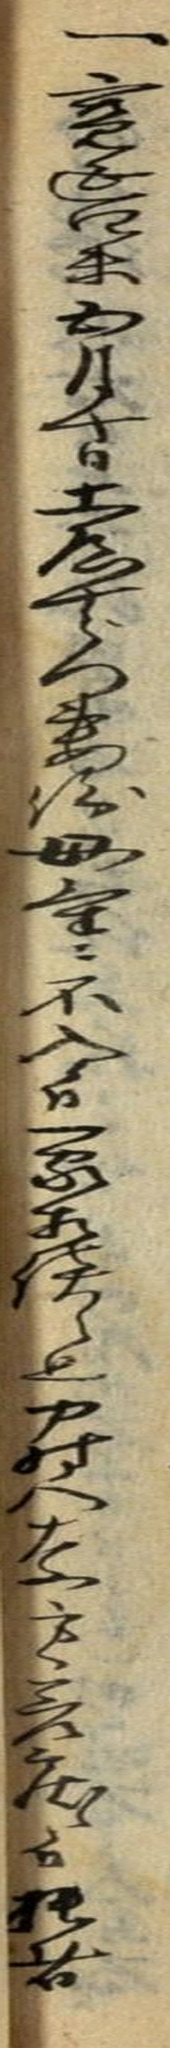一寛延四未五月十日土屋十郎右衛門妻儀母気ニ不入ニ付一家相談之上中村八大夫方へ差戻候ニ付拙者
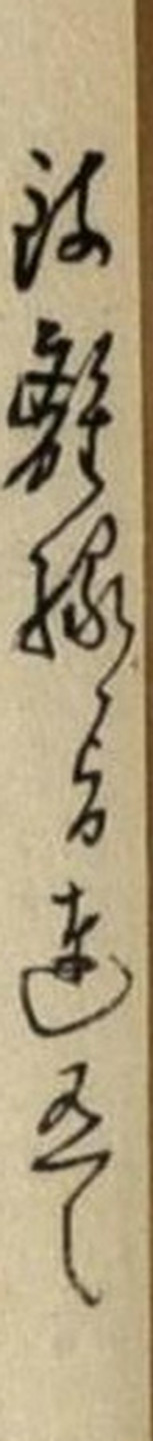致離縁候旨達有之
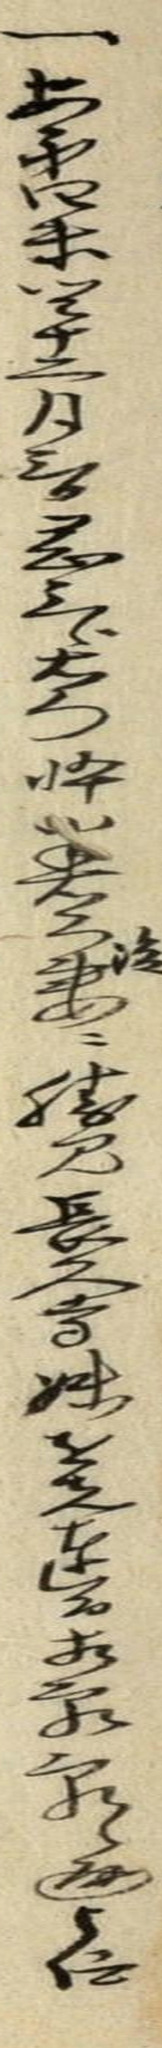一安永四未閏十二月三日岡三郎右衛門悴半右衛門後妻ニ勝見長久寺妹を先達而相願願之通被仰
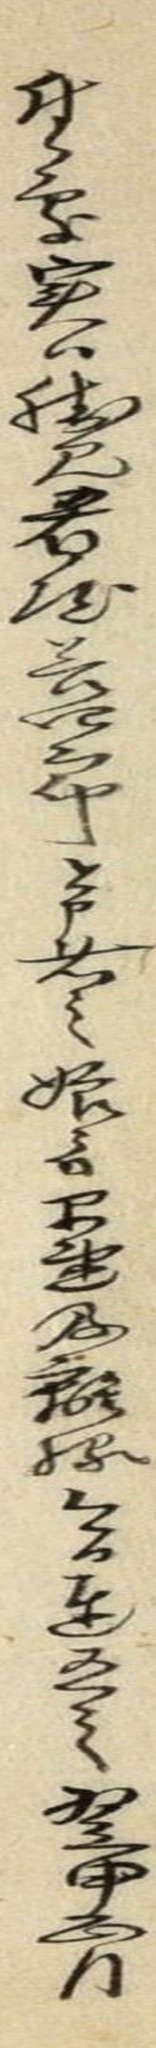付候処実ハ勝見肴屋善四郎と申者之娘ニ付早速及離縁旨達有之翌申正月
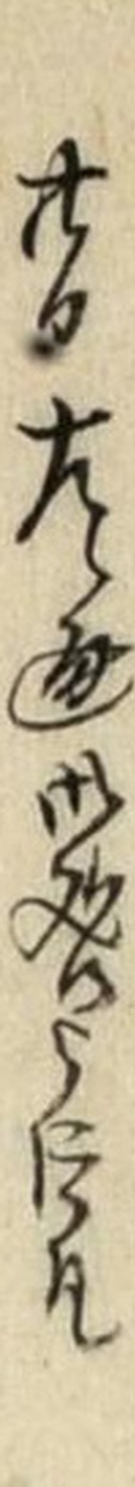廿日左之通御咎被仰付候
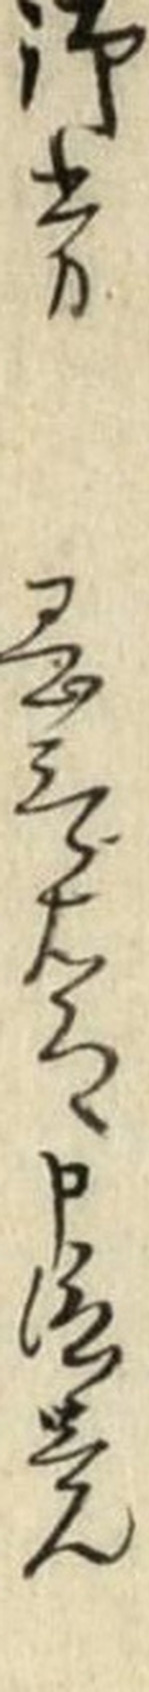御書付岡三郎右衛門へ申渡覚
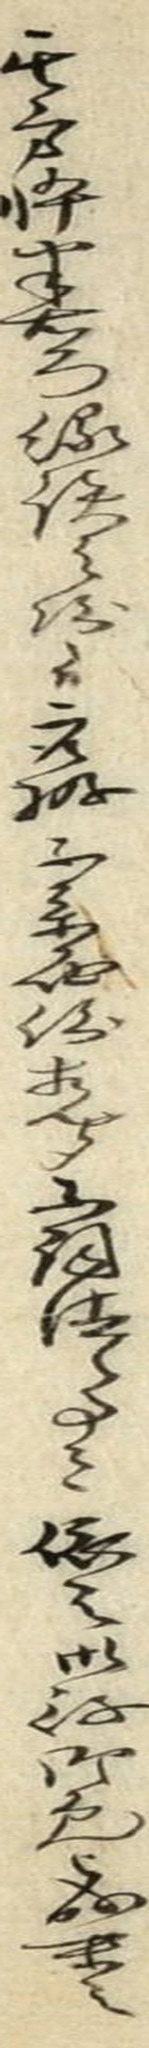其方悴半右衛門縁談之儀ニ付取扱不参届儀相聞不調法之事ニ候依之御役御免被成末之
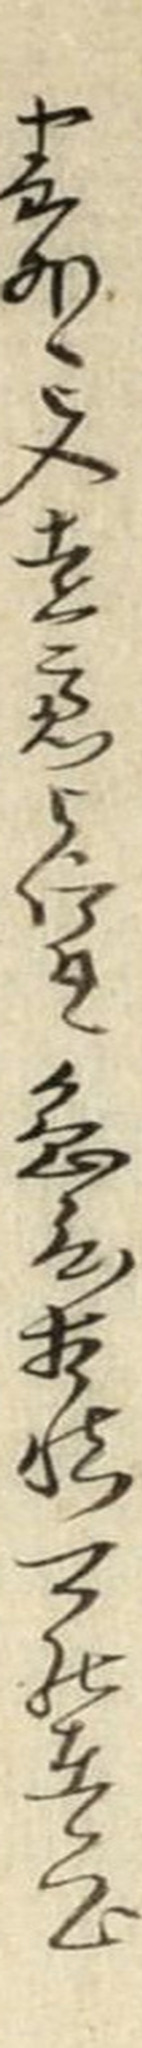番外へ被入遠慮被仰付候急度相慎可罷在候以上
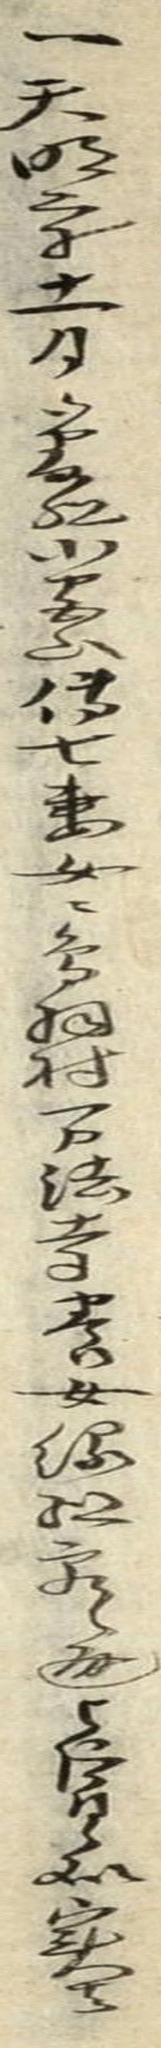一天明二刁十一月御番組小宮山伝七妻女ニ鳥羽村万法寺養女縁組願之通被仰付候処実者
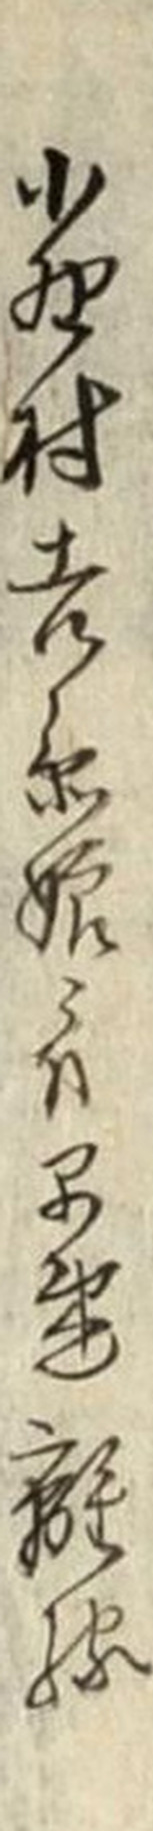小野村吉兵衛娘ニ付早速離縁
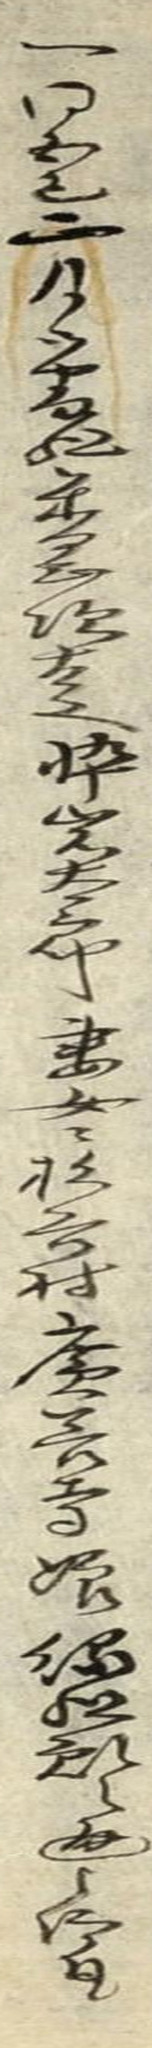一同五巳二月御番組米岡次大夫悴岩太郎妻女ニ杉谷村広善寺娘縁組願之通被仰付候
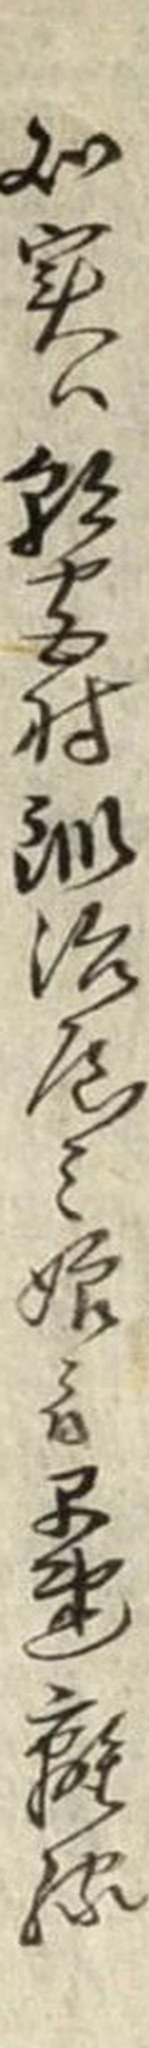処実は朝宮村鍛冶屋之娘ニ付早速離縁
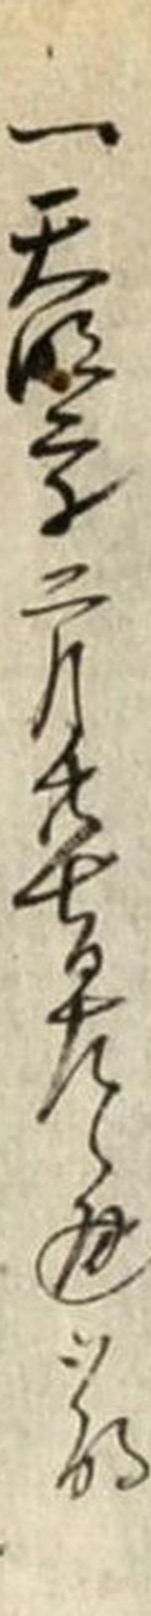一天明二刁二月廿七日左之御触
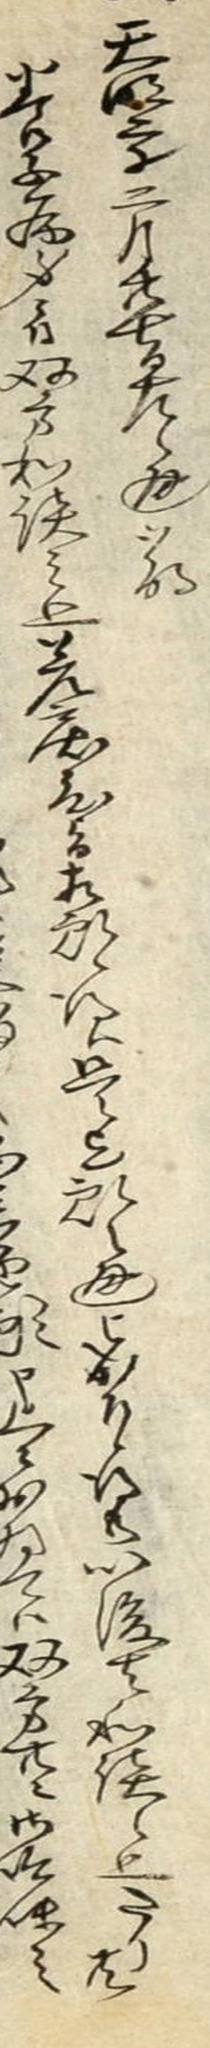養子病身ニ付双方和談之上差戻度旨相願候得ハ是迄願之通被成下候得共以後者和談之上たり共
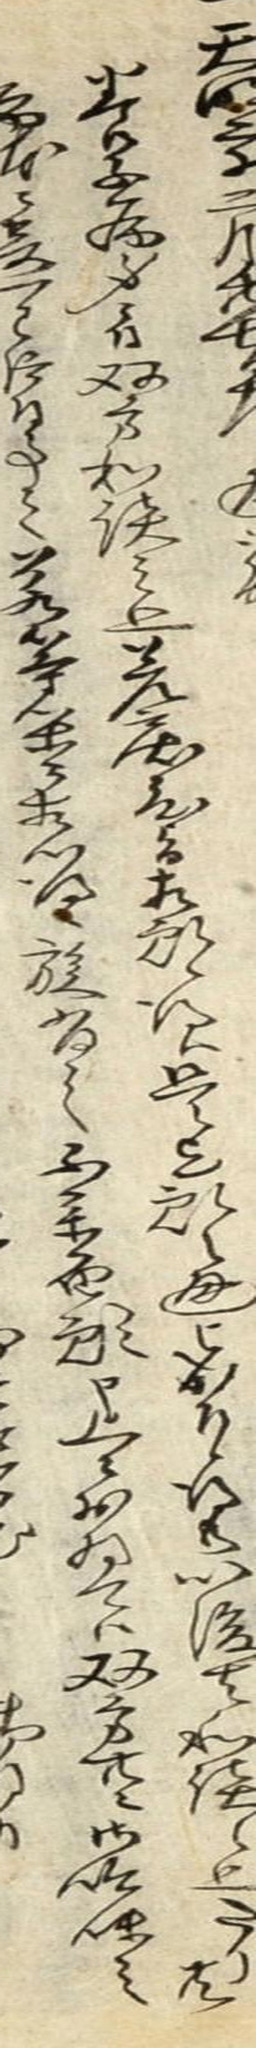病体ニ寄可被仰付事ニ候若等閑ニ相心得候族有之不参届願申上ニおゐてハ双方共ニ御吟味之
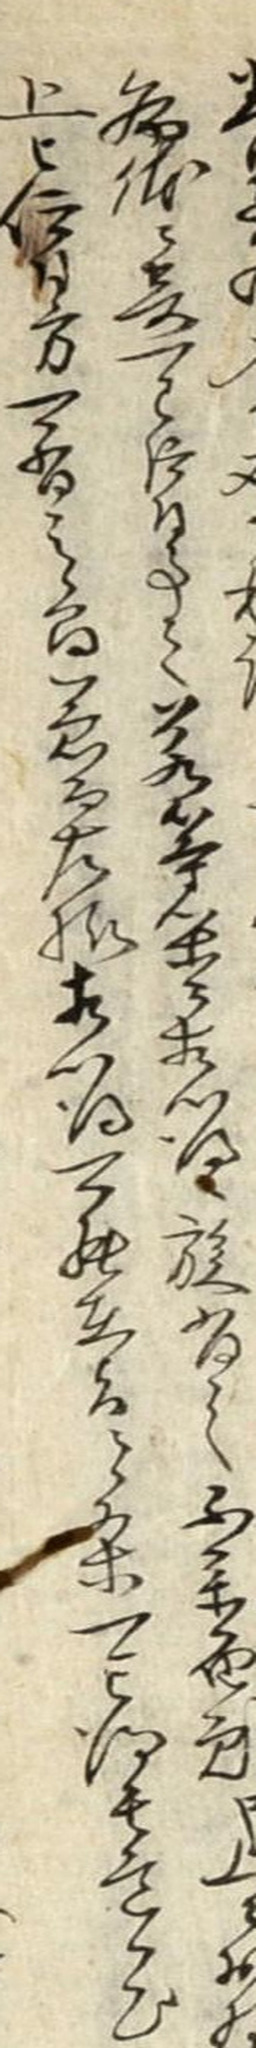上被仰付方可有候之間兼而左様相心得可罷在旨ニ候条可被得其意候以上
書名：養子縁組之部
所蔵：福井県文書館 Fukui Prefectural Archives
